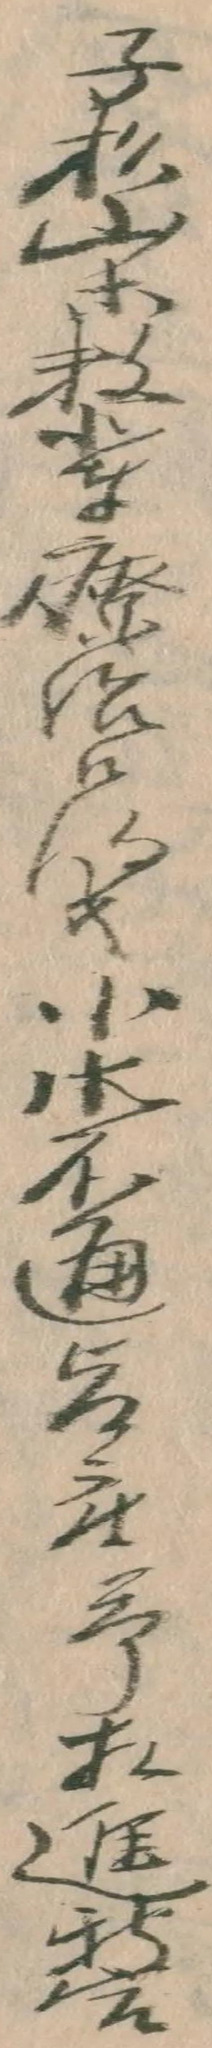子杉山等数輩療治候得共小水不通旨ニ付予相進新宮
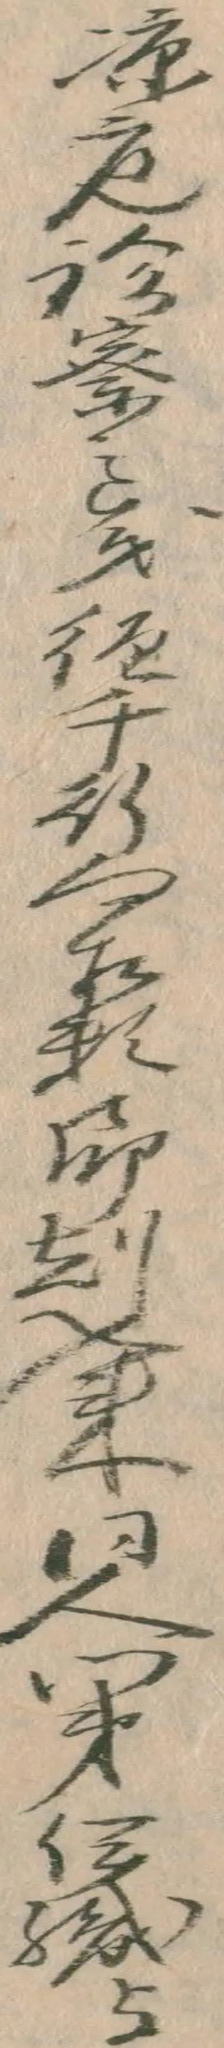涼庭診療之義経先行向相頼聊刻入来同人門弟伊織と
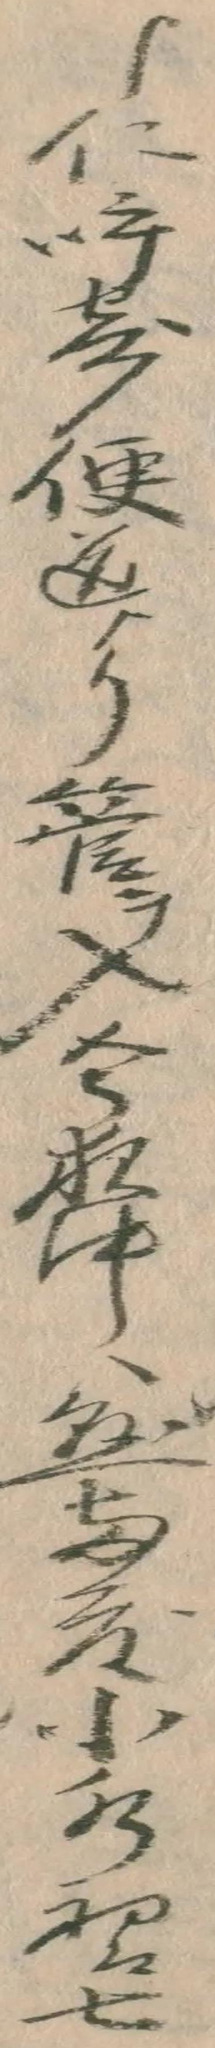申仁呼寄便道より管ヲ入今夜中へ懸両度小水初而七
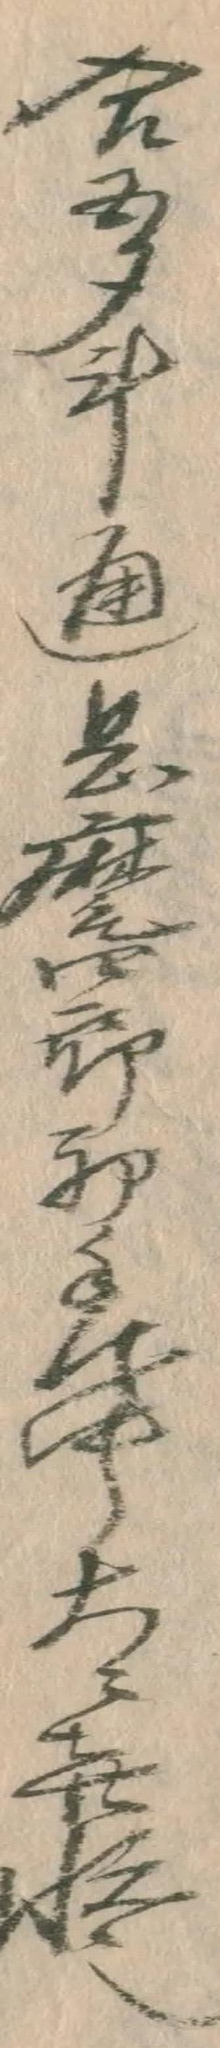合五勺斗通息磨四郎初手代中大ニ喜悦也
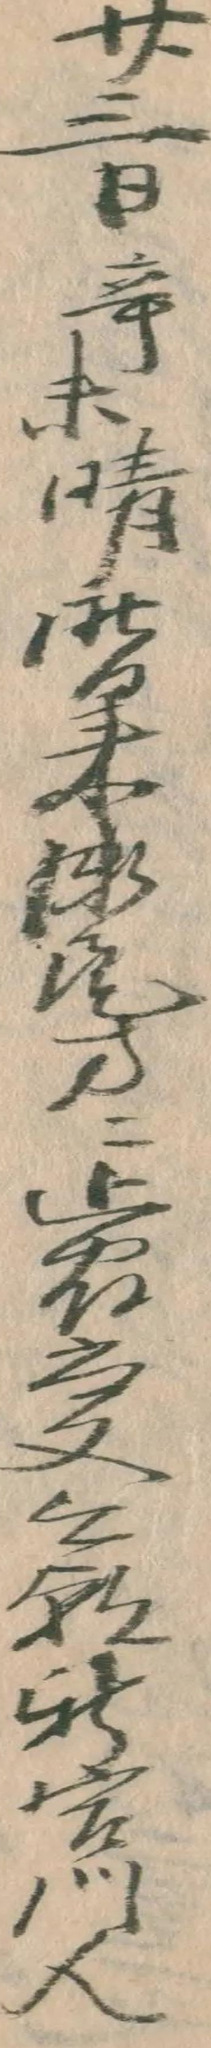廿三日辛未晴昨日来瀬尾方ニ止宿尚又今朝新宮門人
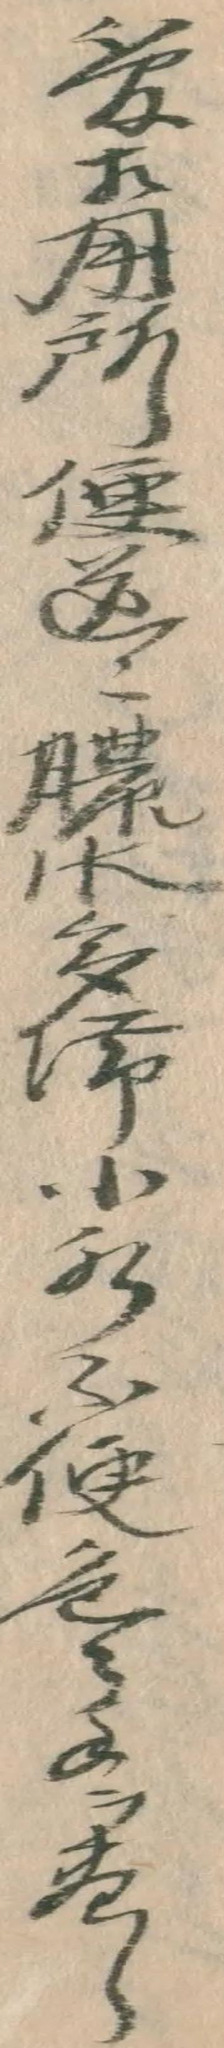管相用所便道に膿水多滞小水不便色々手を尽し
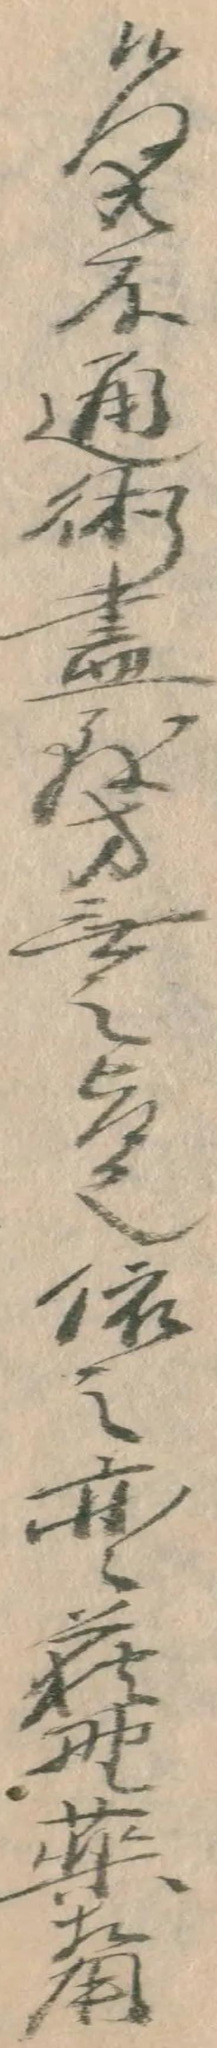候得共不通術盡致方無之旨也依之亦々荻野薬相用
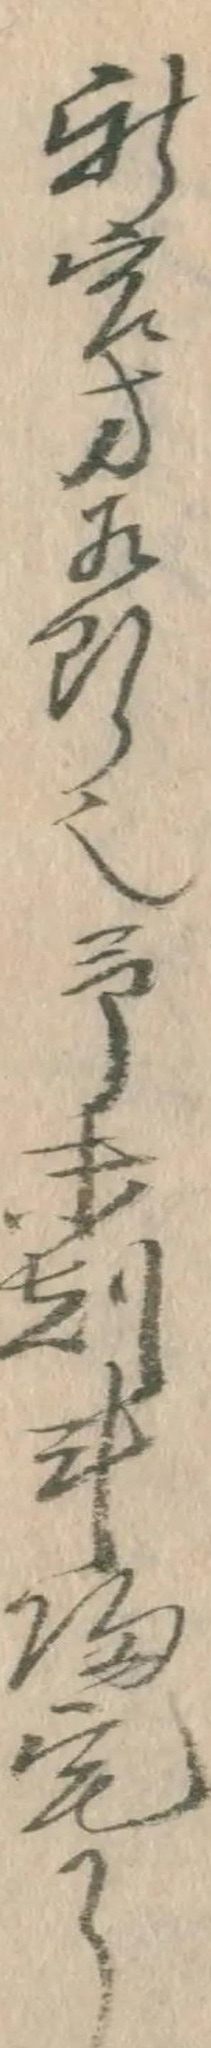新宮方相断也予未刻斗帰宅了
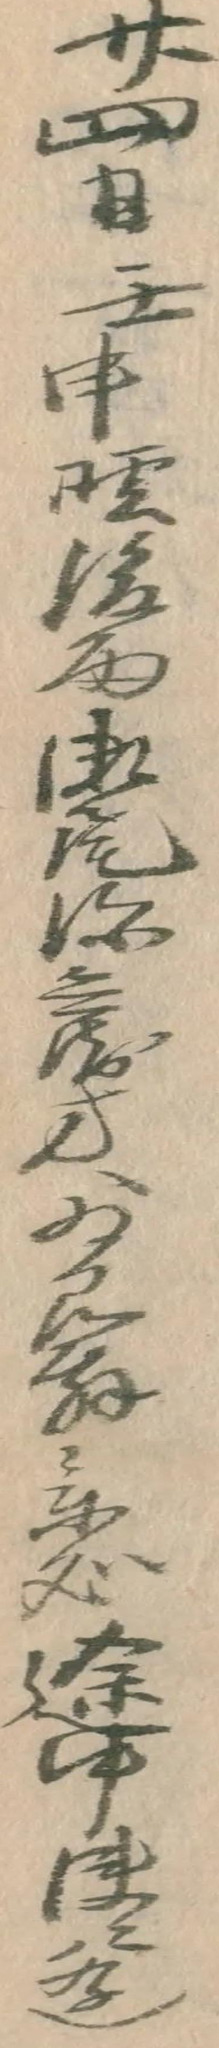廿四日壬申曇後雨瀬尾弥兵衛方へ為見舞に参処途中使に逢

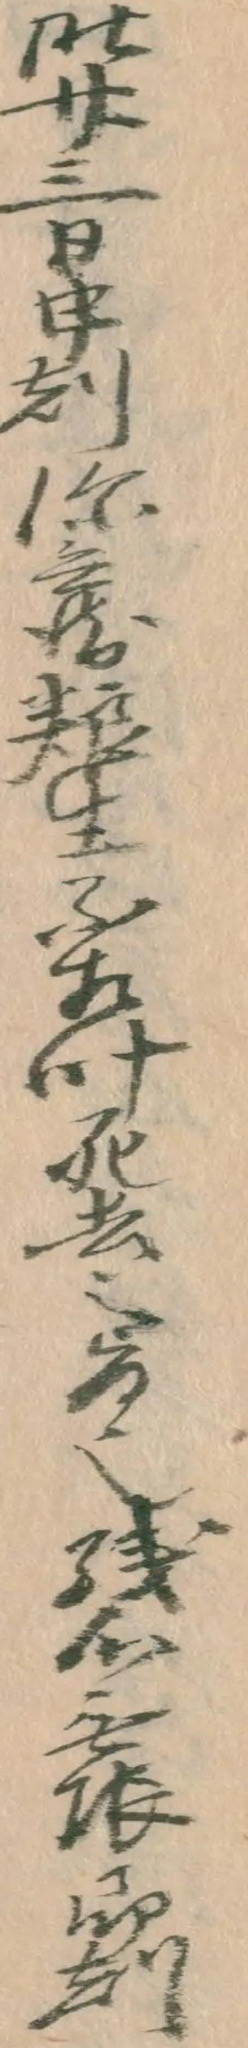昨廿三日申刻弥兵衛養生不相叶死去之旨也残心無限即刻
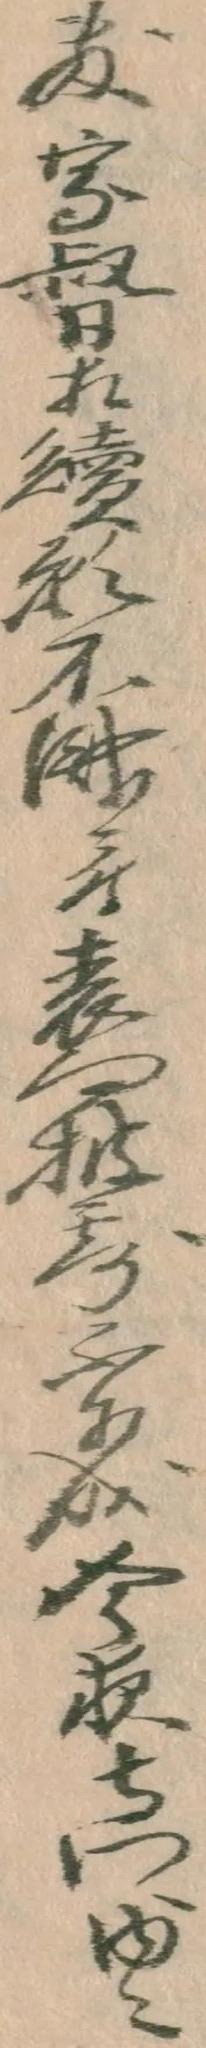敷家督相續願不済ニ付表向披露不相成今夜寺門内々
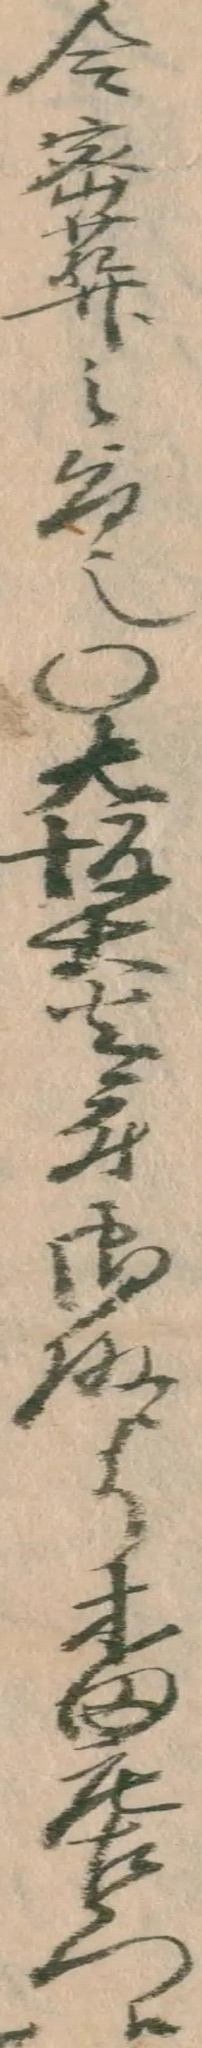令密葬之旨也○大坂大火に付御殿より木田庄左衛門え
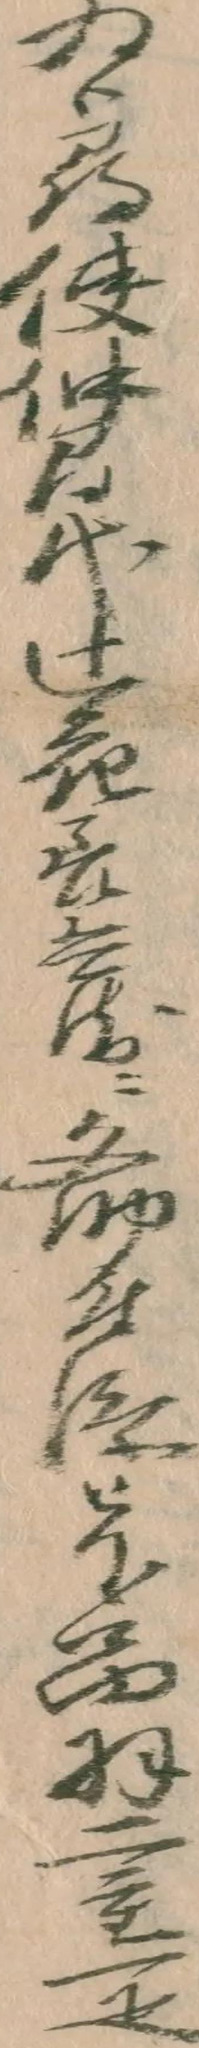為御尋使仲間代辻花善兵衛ニ久助付添被下候品羽二重一疋
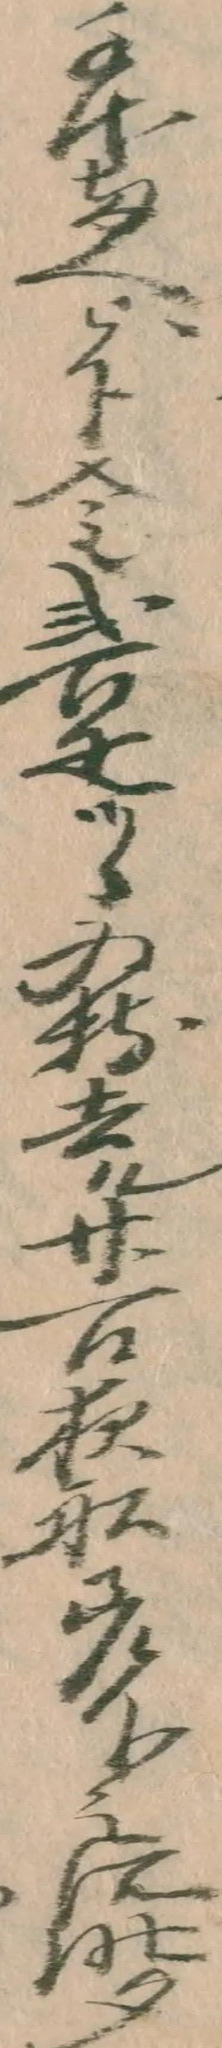手代両人被下金弐百疋ツヽ為持去ル廿一日夜船差下之所昨夕
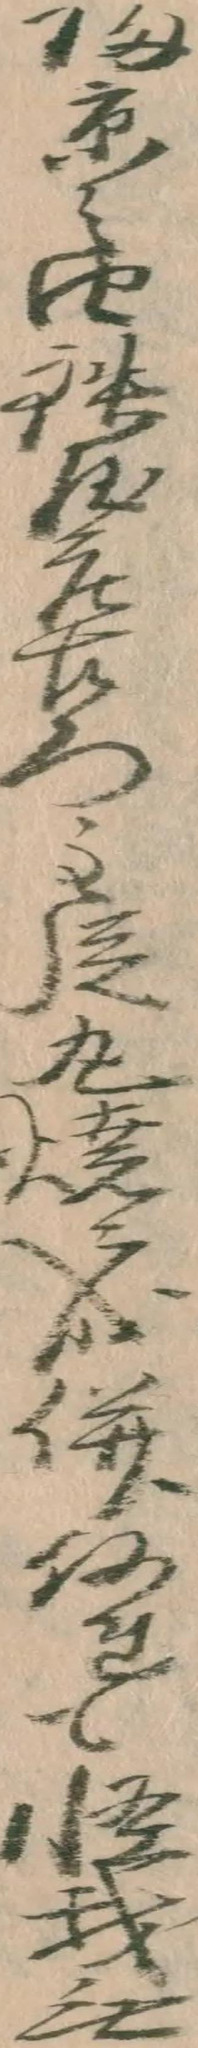帰京之由鉄屋庄左衛門主従丸焼ニ成併何れも怪我無
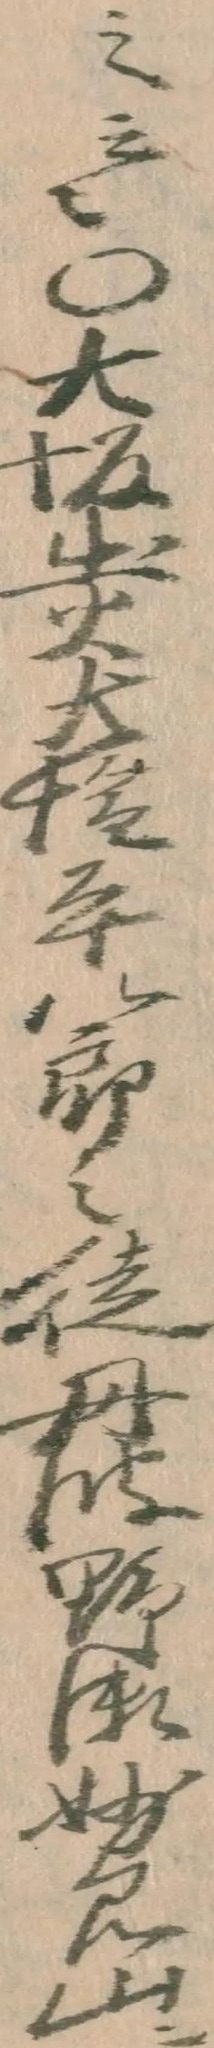之云々○大坂出火大塩平八郎之徒丹波野瀬妙見山ニ
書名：賀茂社記録. 第67冊
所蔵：国立国会図書館 National Diet Library, JAPAN
